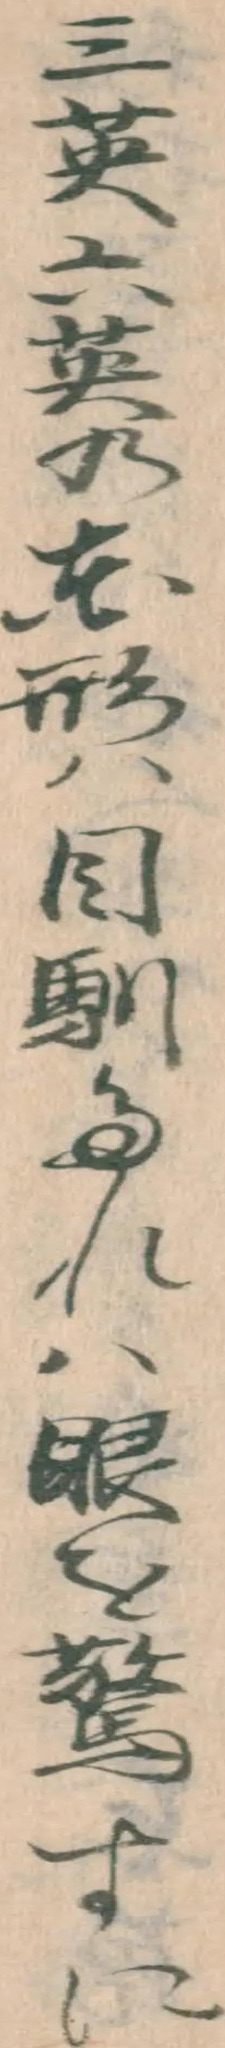三英六英の花形は目馴たれは眼を驚すに
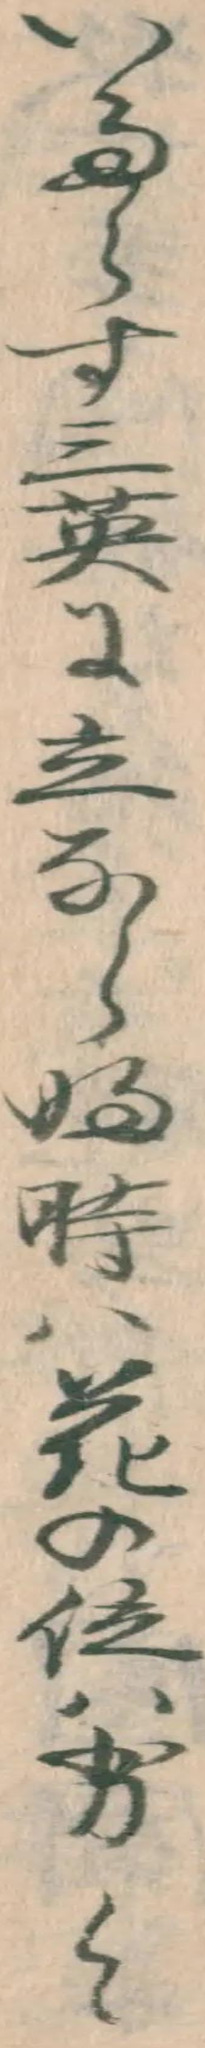いたらす三英に立ならふ時は花の位は劣て
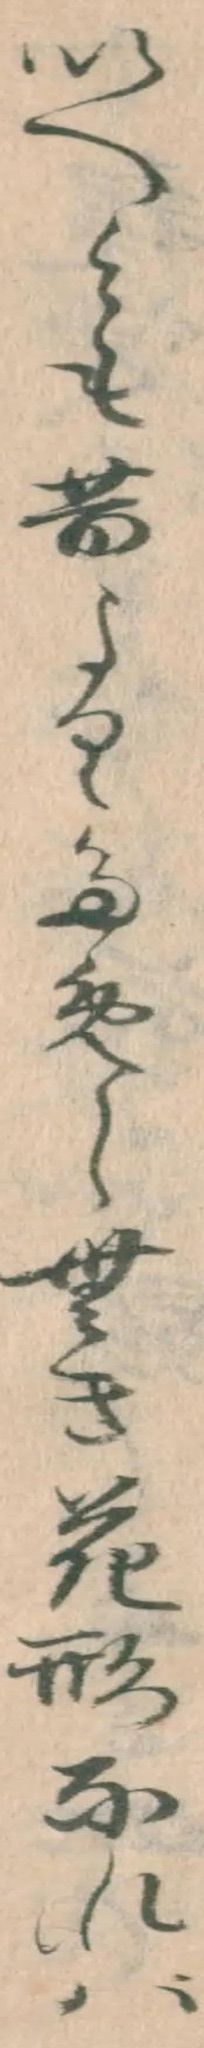候へとも昔よりためしなき花形なれは
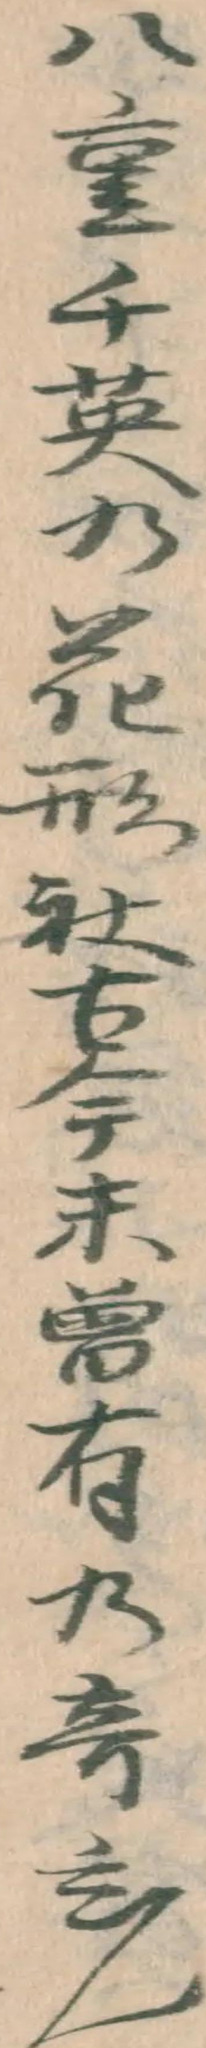八重千英の花形社古今未曾有のきひん

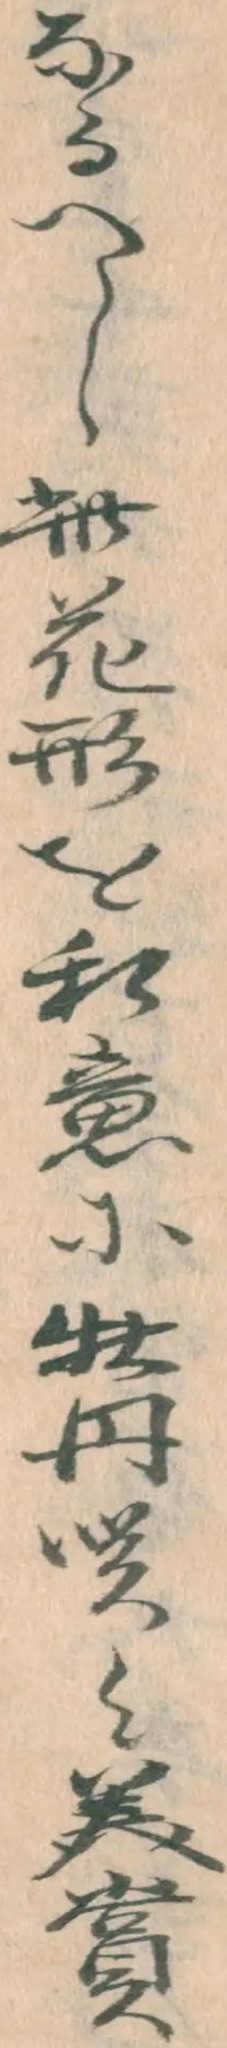なるへし此花形を私意に牡丹咲と美賞
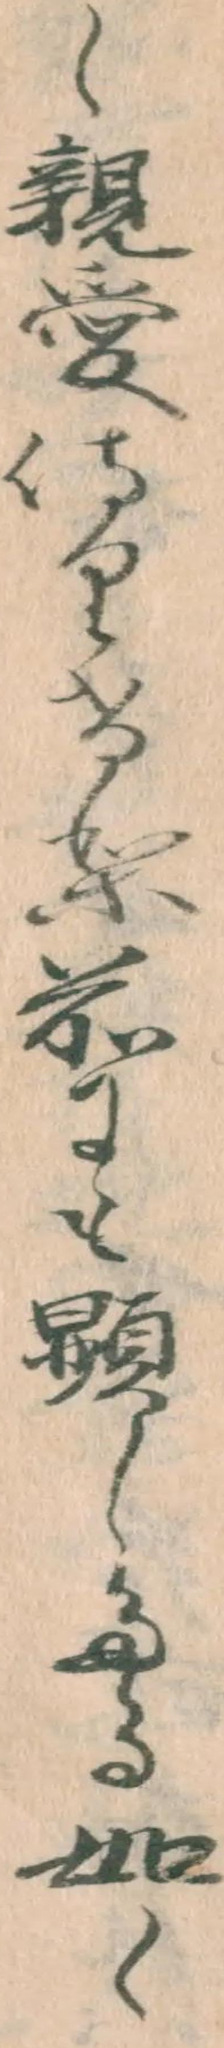し親愛侍りけり前にも顕したる如く
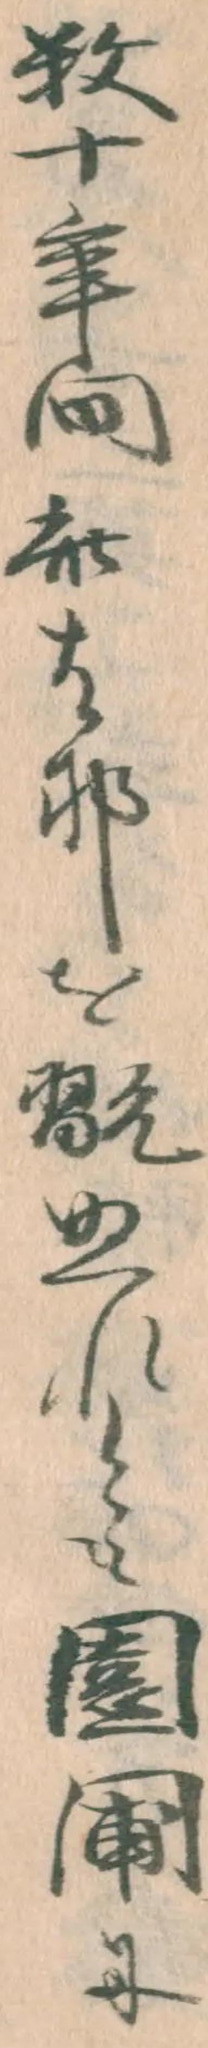数十年間此志那を翫ぬれとも園圃に
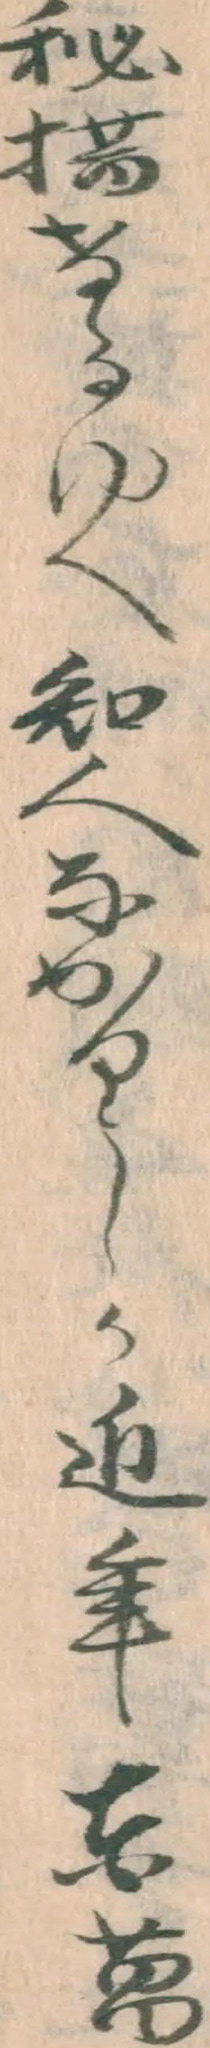秘措けるゆへ知人なかりしか近年花菖
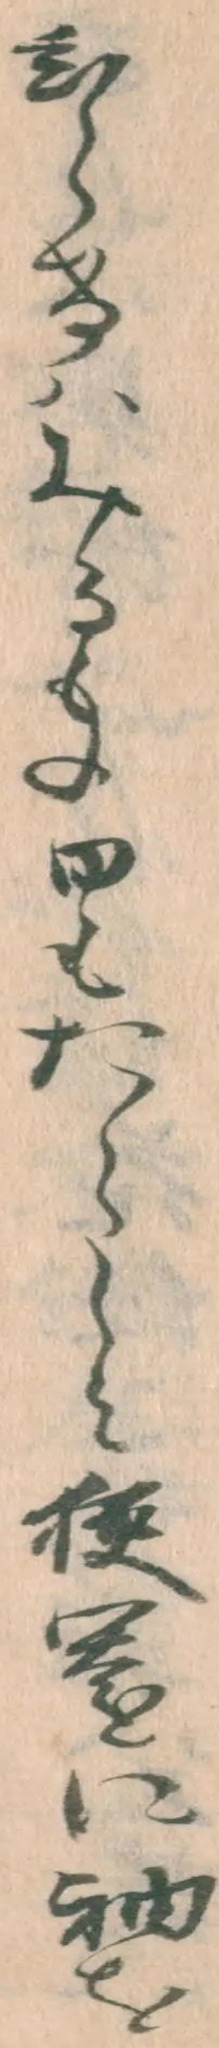ひらけハみるもの日もたらしと狭岡に袖を
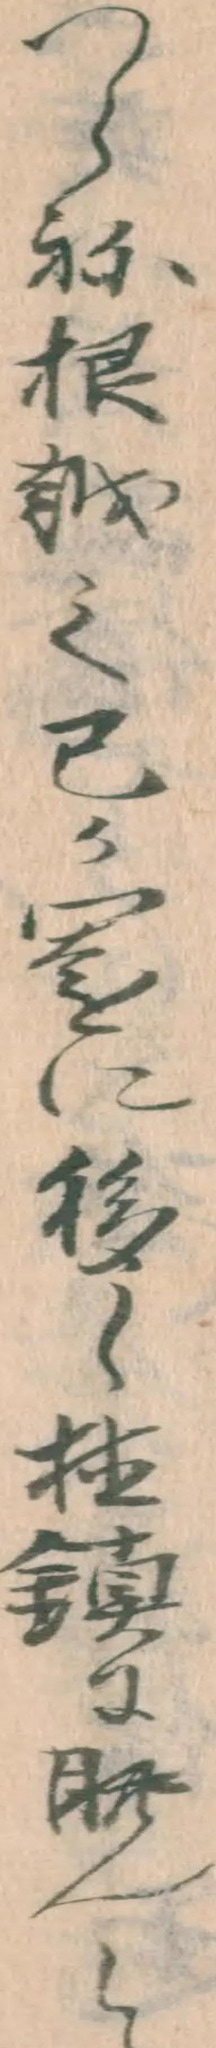つらね根を之己か岡に移し植鎮に眺んと
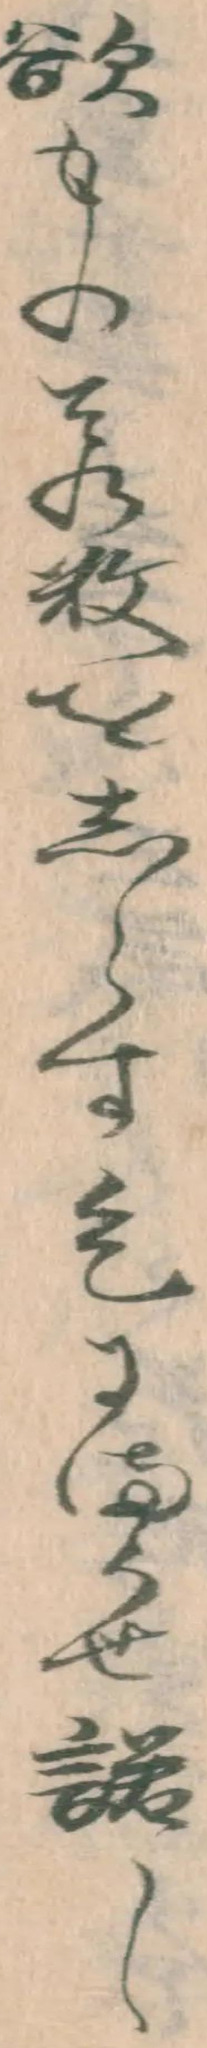欲ものその数をしらす乞にまかせ談し
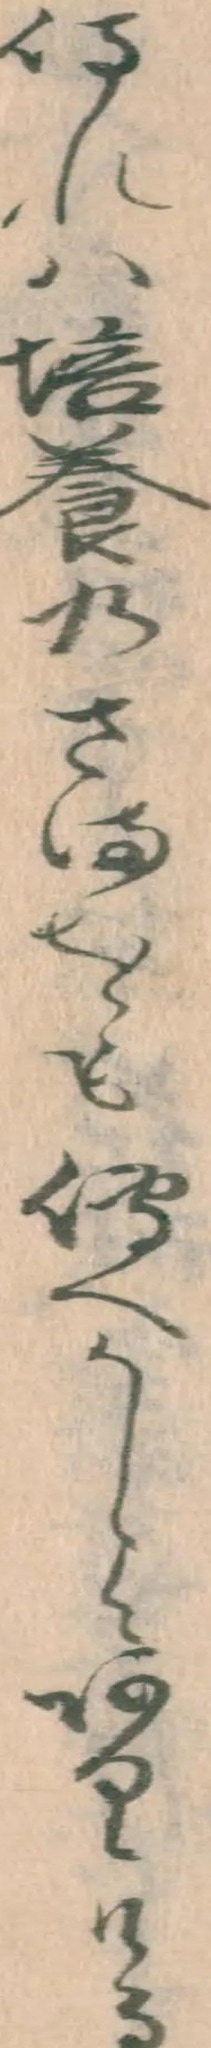侍れハ培養のさまをも伝へありける
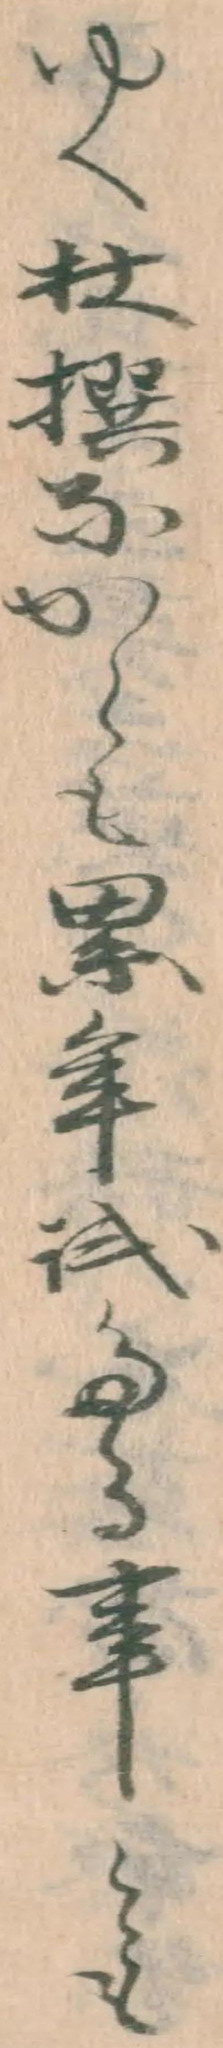ゆへ杜撰なからも累年試たる事とも
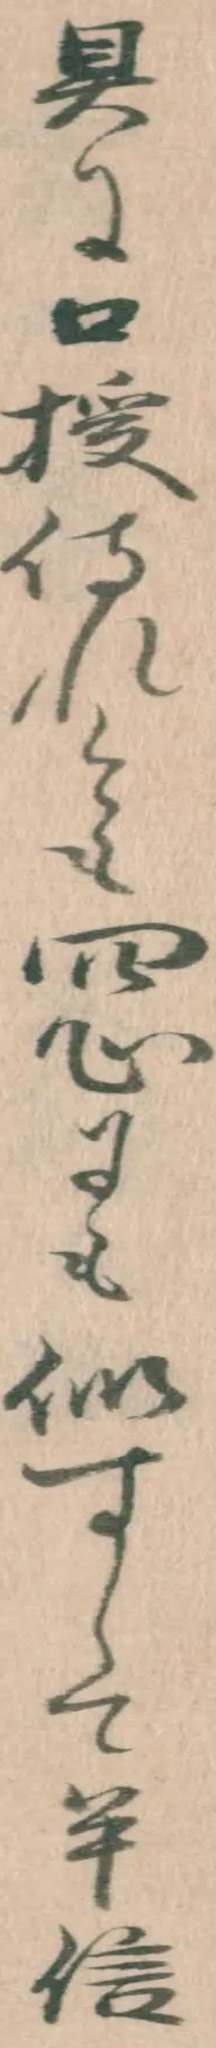具に口授侍れとも冗心にも似すして半信
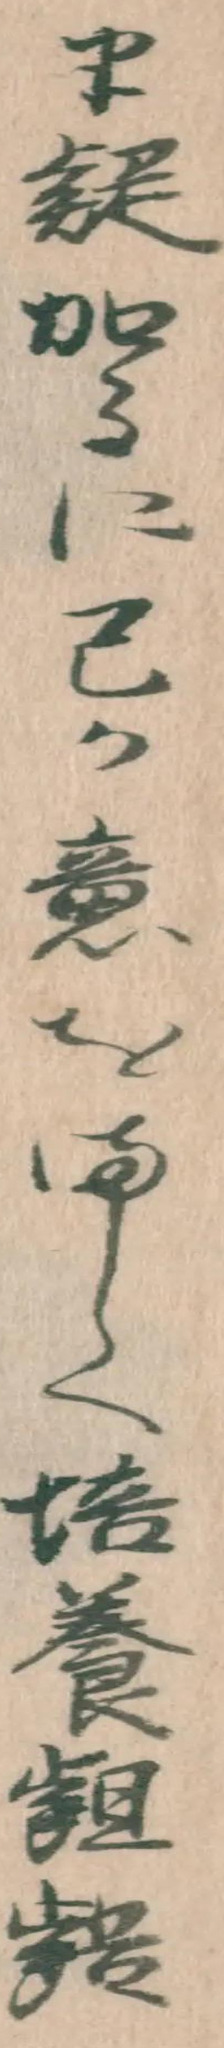半疑加るに己か意を帰して培養
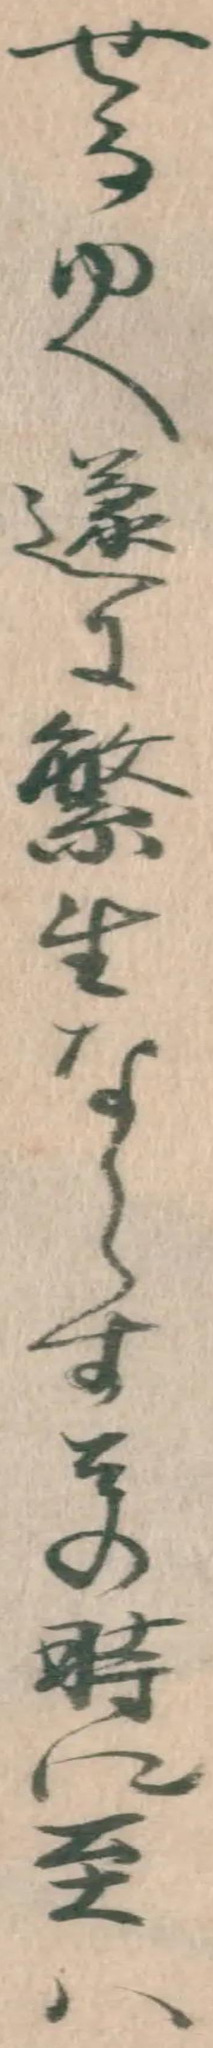せるゆへ遂に繫生ならすその時に至ハ
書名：花菖培養録
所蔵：国立国会図書館 National Diet Library, JAPAN
